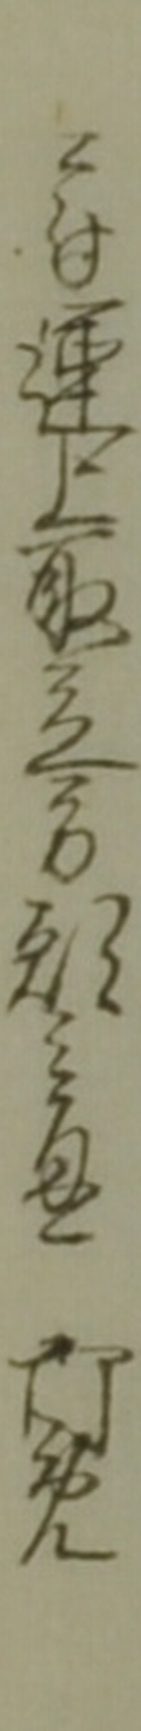ニ付運上取立方願之通御免
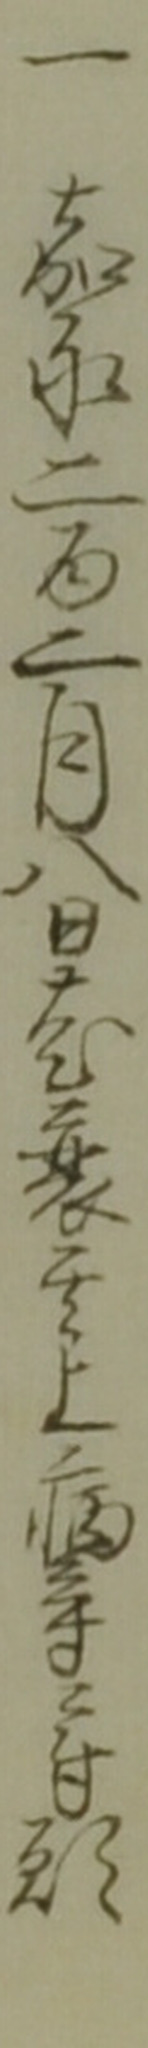一嘉永二酉二月八日老衰其上病気ニ付願
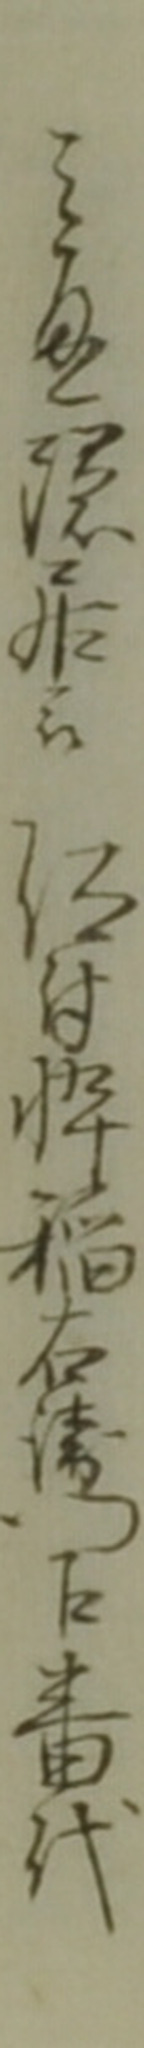之通隠居被仰付忰稲右衛門江番代
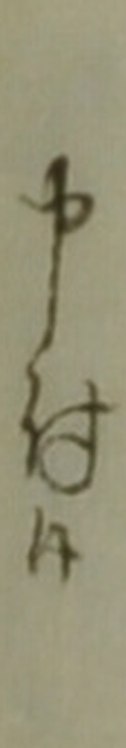申付候
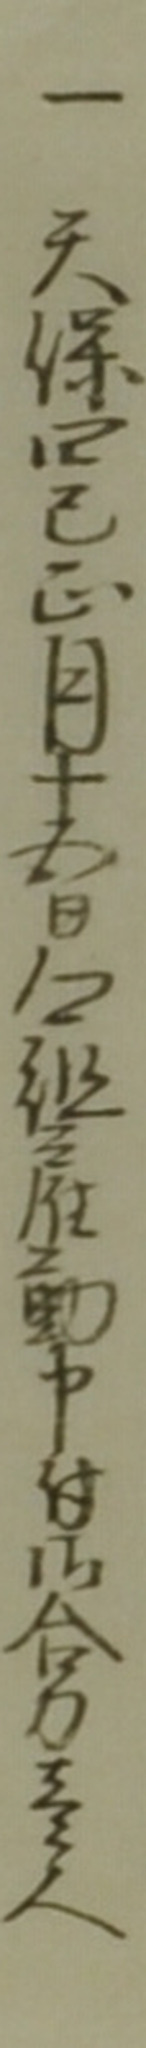一天保四巳正月十五日郷組雇勤申付御合力壱人
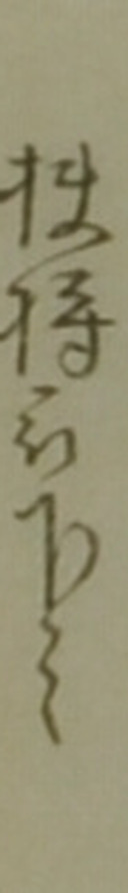扶持被下之
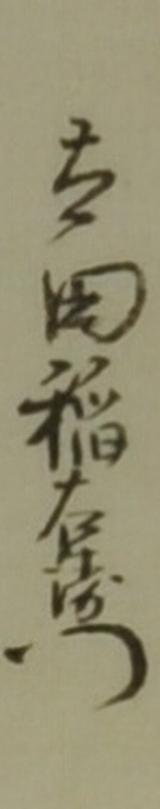古田稲右衛門
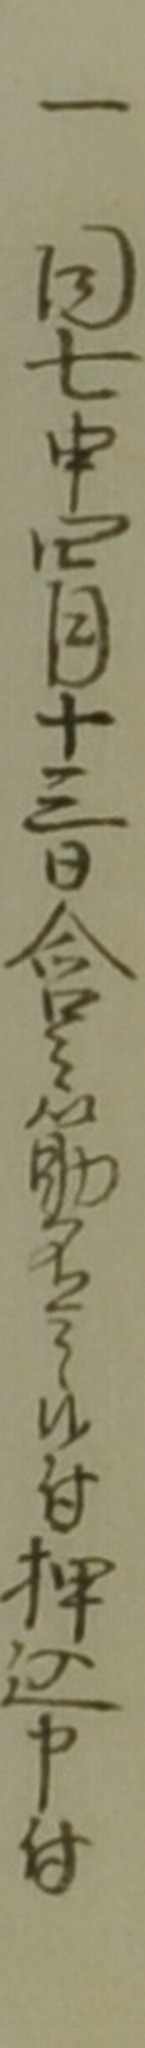一同七申四月十三日含之筋有之候付押込申付
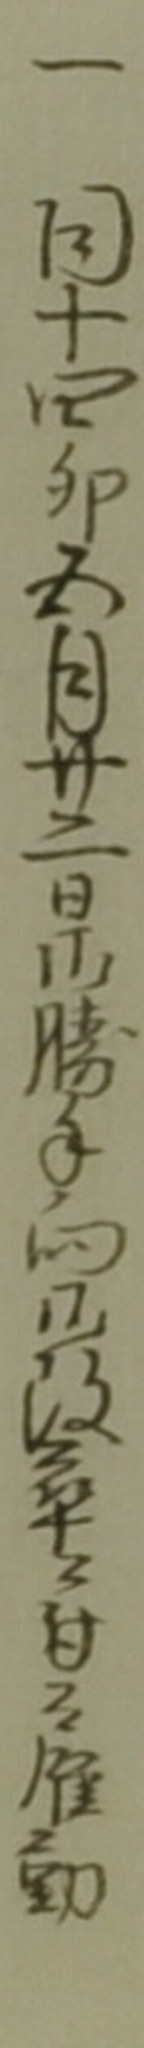一同十四卯五月廿二日御勝手向御改革ニ付雇勤
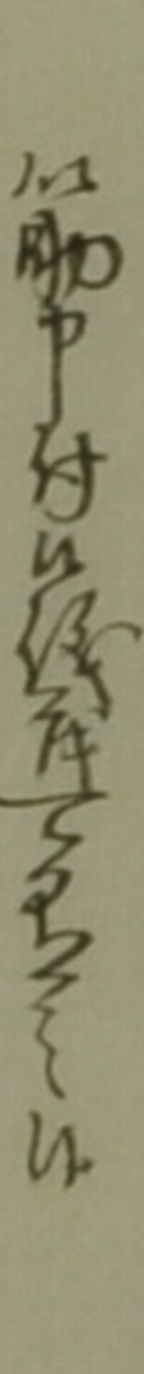筋申付候儀茂可有之候
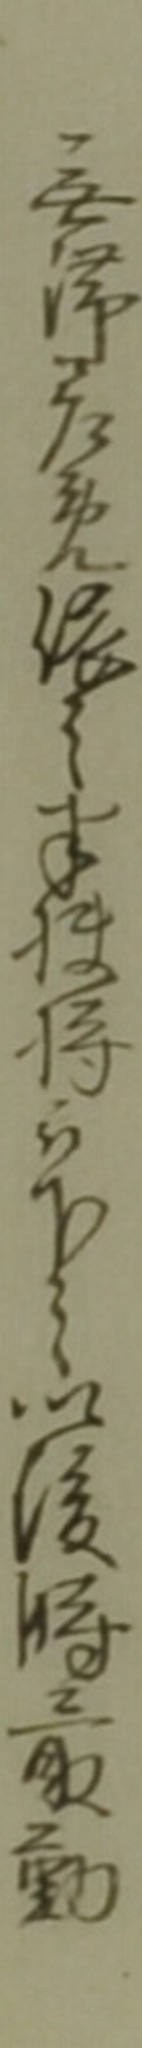無滞差免依之半扶持被下之以後時最勤
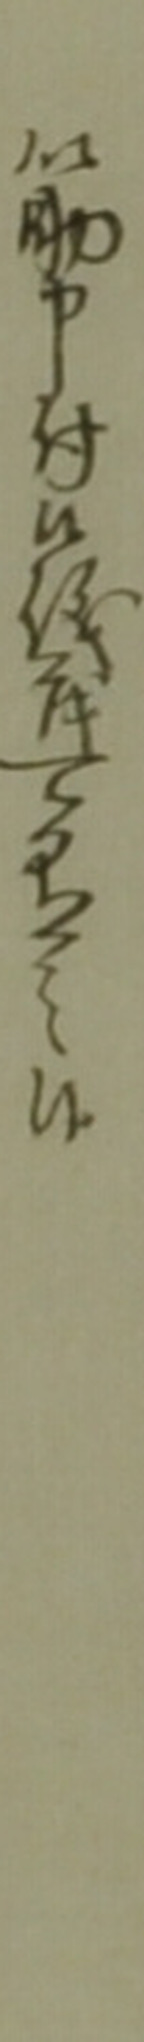筋申付候儀茂可有之候
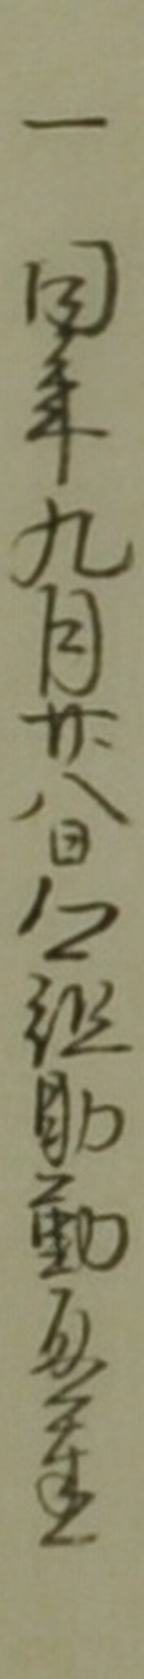一同年九月廿八日郷組助勤通達
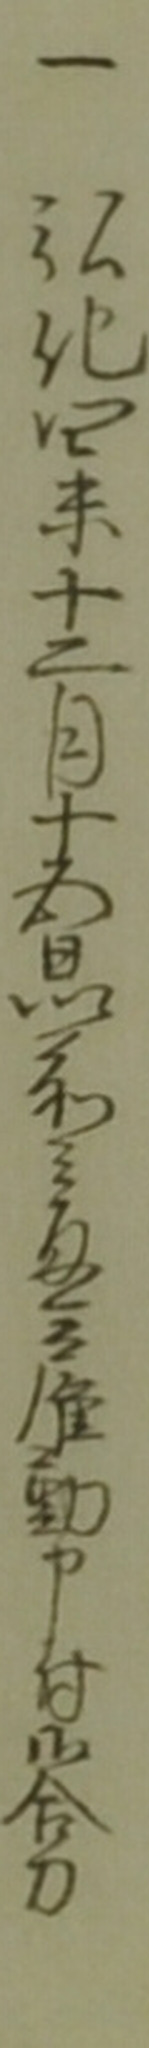一弘化四未十二月十五日以前之通雇勤申付御合力
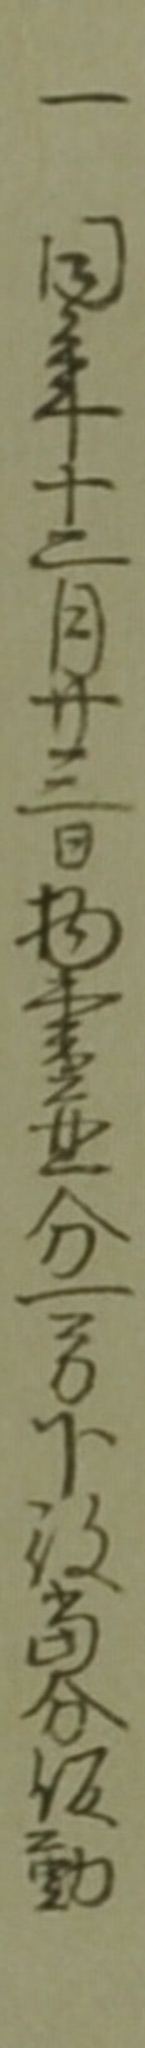一同年十二月廿三日物書並分一方下役当分仮勤
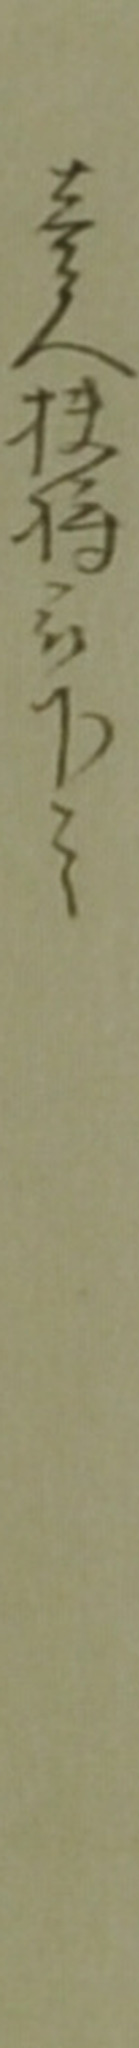壱人扶持被下之
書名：無足諸士勤仕録（九）
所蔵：伊那市立高遠町図書館・合同会社AMANE
